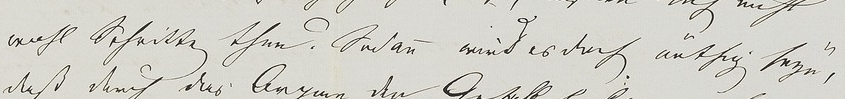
wohl Schritte thun. Sodann wird es doch nöthig seyn,
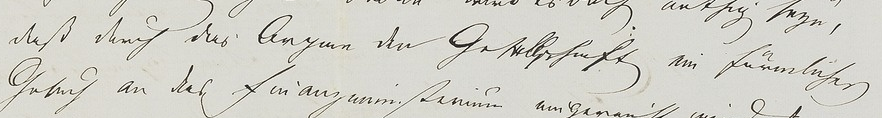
daß durch das Organ der Gesellschaft ein förmliches
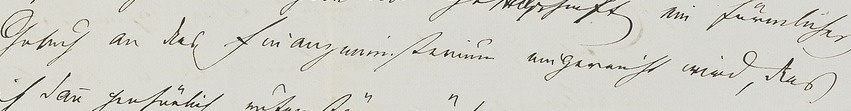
Gesuch an das Finanzministerium eingereicht wird, das
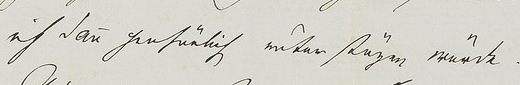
ich dann persönlich unterstüzen würde. –
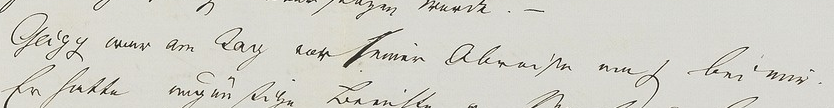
Geigy war am Tag vor seiner Abreise noch bei mir.
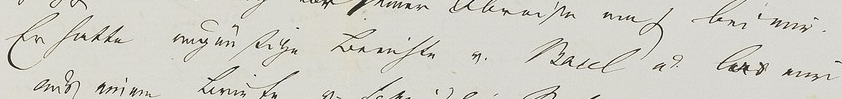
Er hatte ungünstige Berichte v. Basel u. las mir
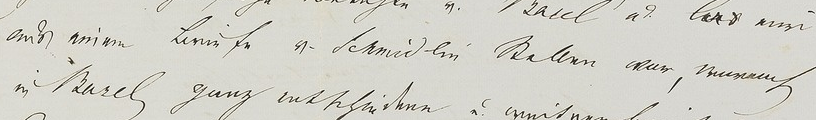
aus einem Briefe v. Schmidlin Stellen vor, wornach
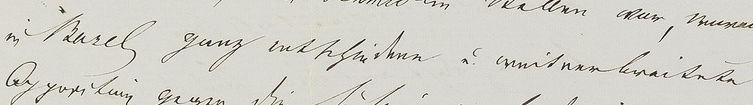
in Basel ganz entschiedene u. weitverbreitete
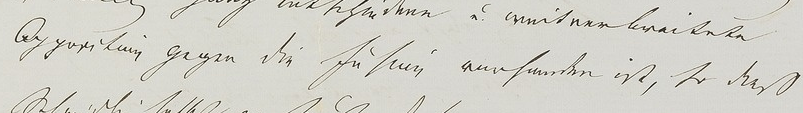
Opposition gegen die Fusion vorhanden ist, so daß
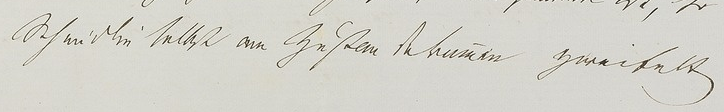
Schmidlin selbst am Zustandekommen zweifelt.
